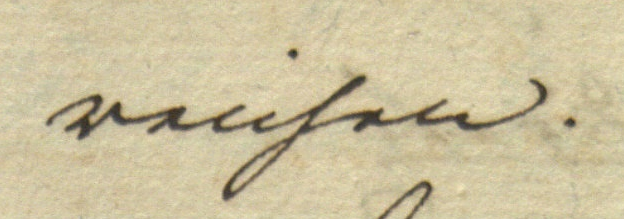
reichen.
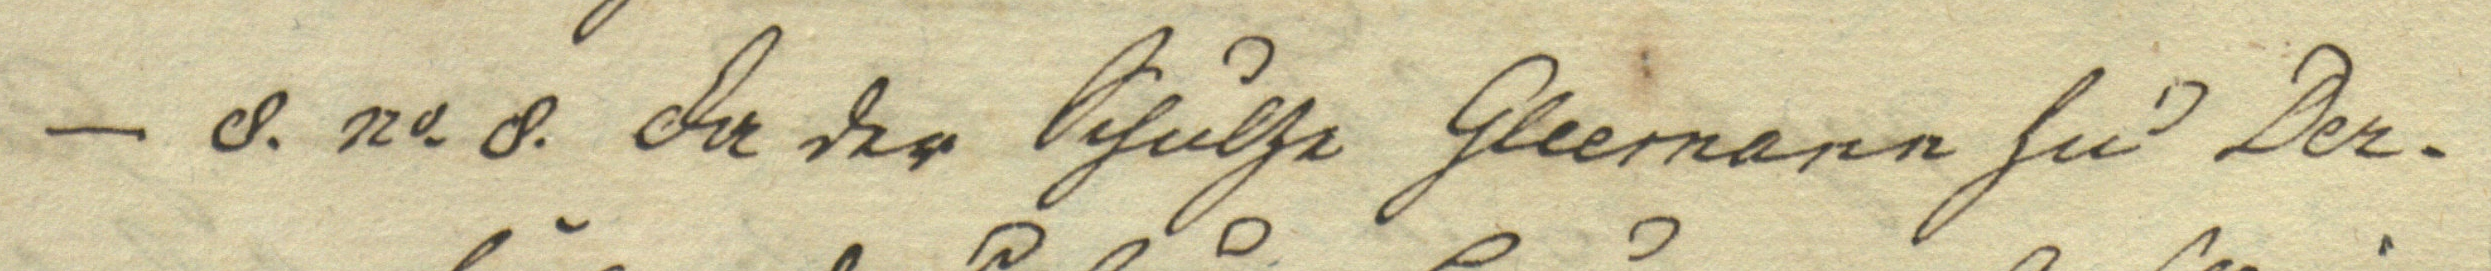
8. No 8. Da der Schulze Gleemann zu Der¬
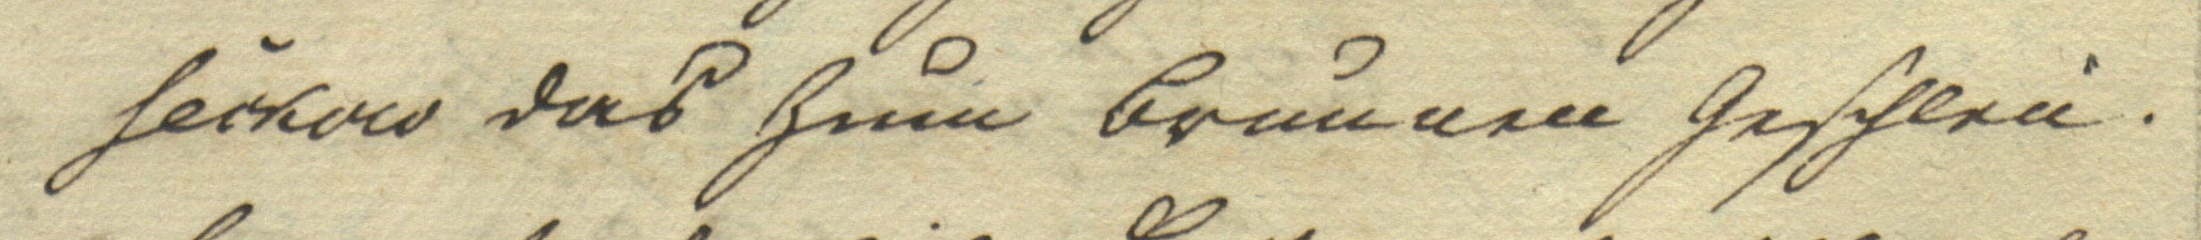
seckow das zum Brunnen Geschleu¬
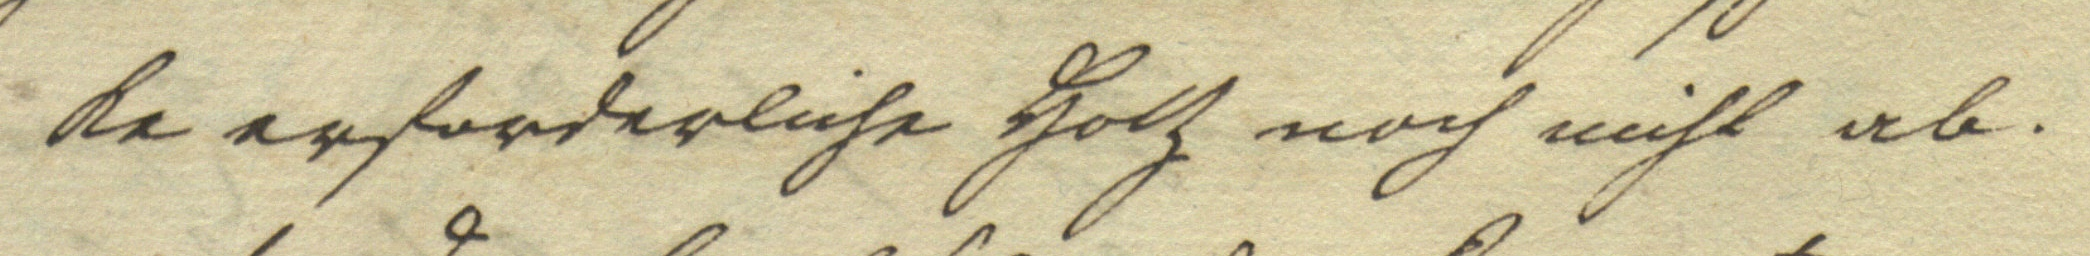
ke erforderliche Holz noch nicht ab¬
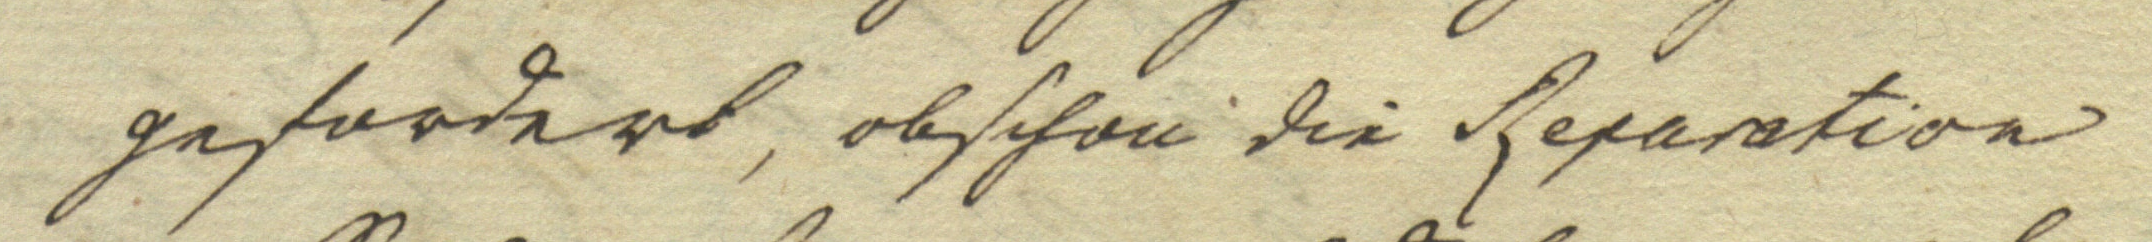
gefordert, obschon die Reparation
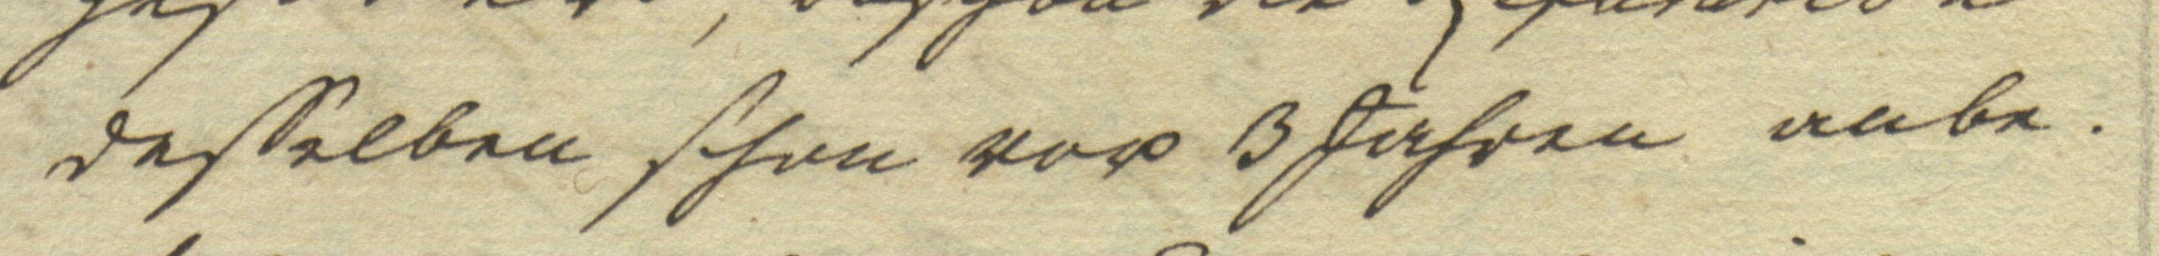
desselben schon vor 3 Jahren anbe¬
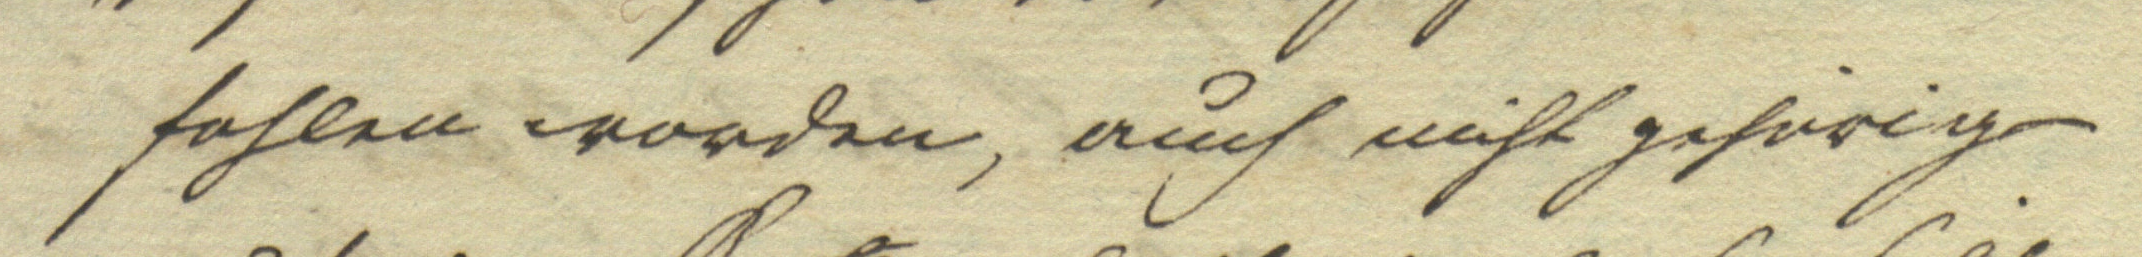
fohlen worden, auch nicht gehörig
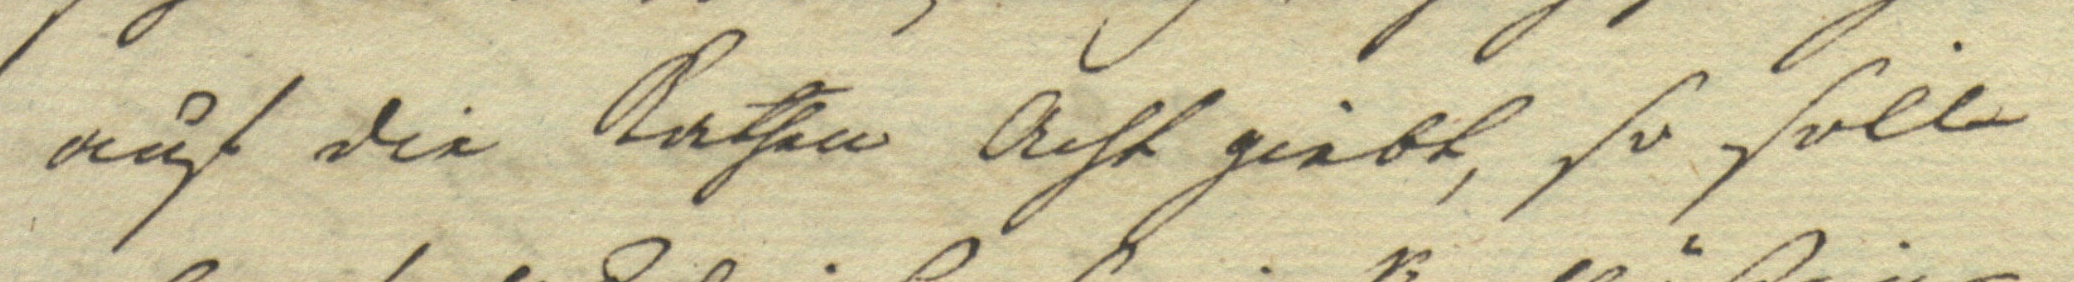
auf die Kathen Acht giebt, so solle
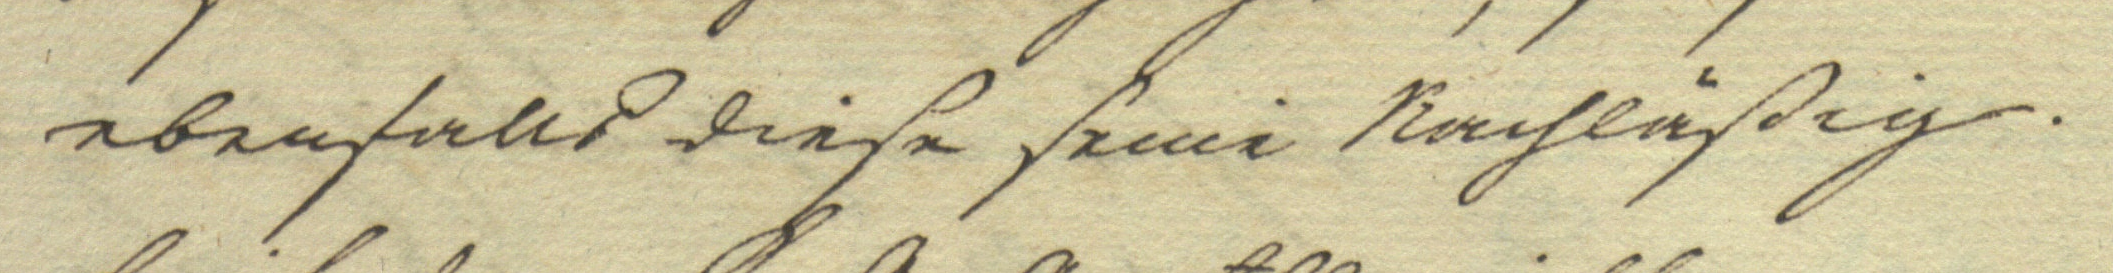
ebenfalls diese seine Nachläßig¬
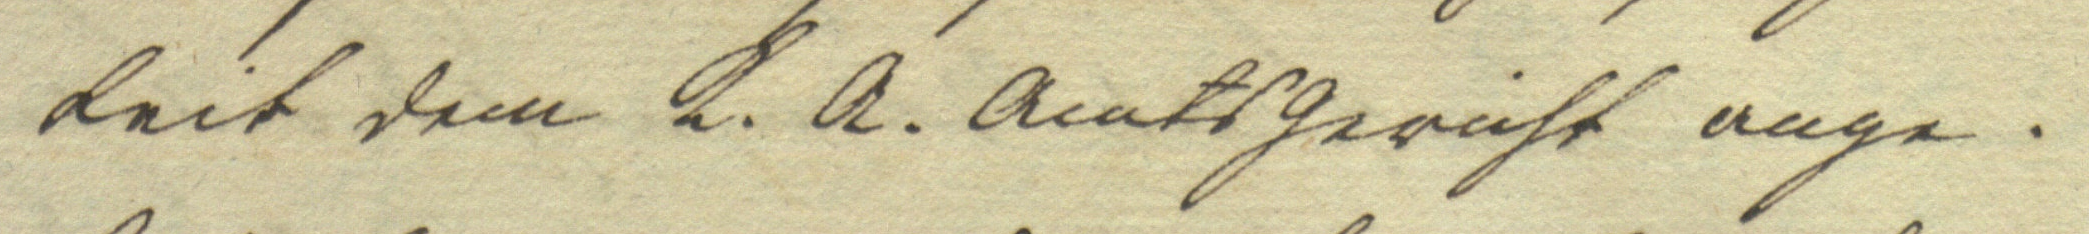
keit dem K. A. Amtsgericht ange¬
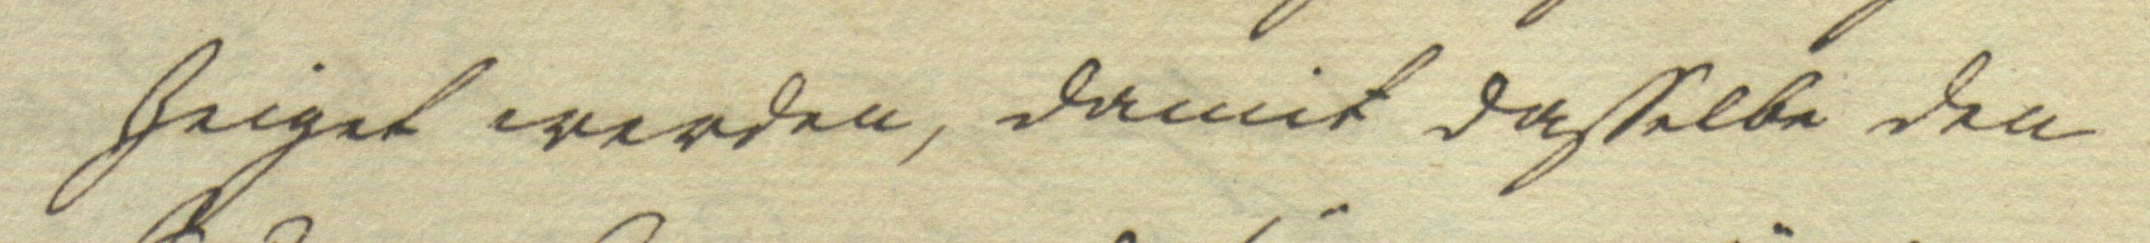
zeiget werden, damit dasselbe den
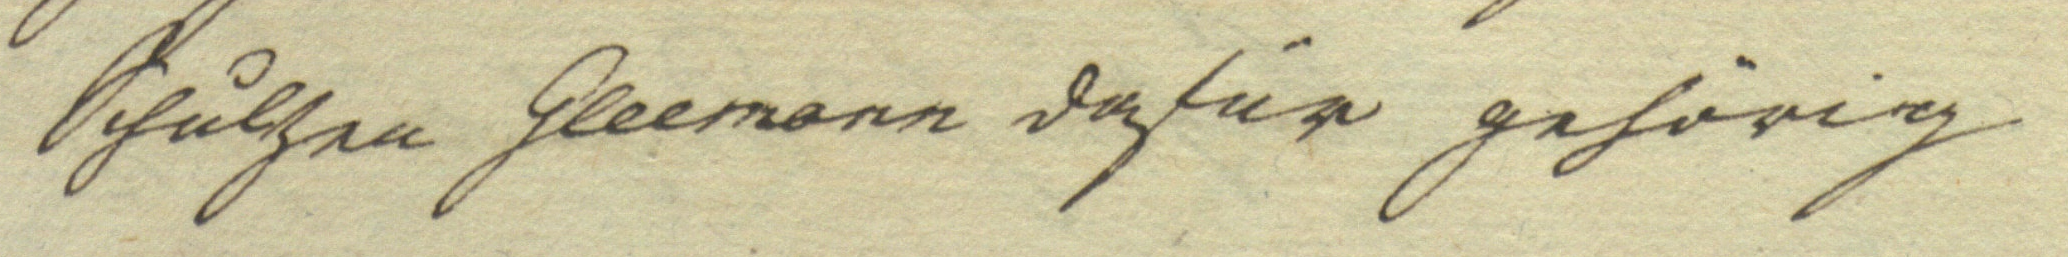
Schulzen Gleemann dafür gehörig
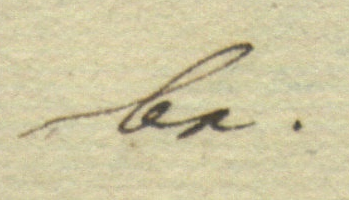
be¬
